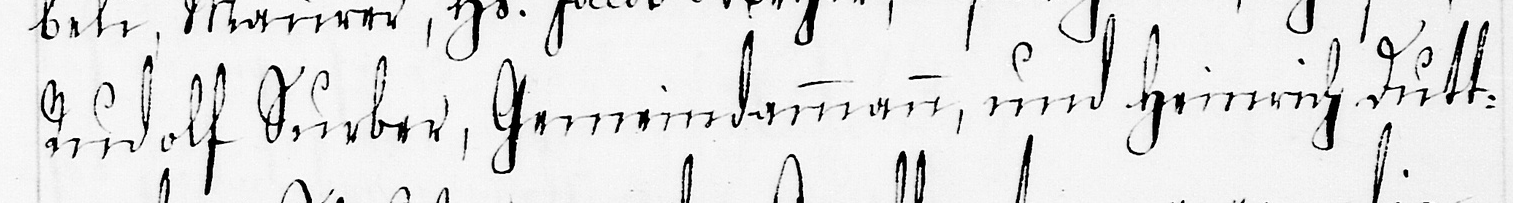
Rudolf Surber, Gemeindammann, und Heinrich Dutt¬
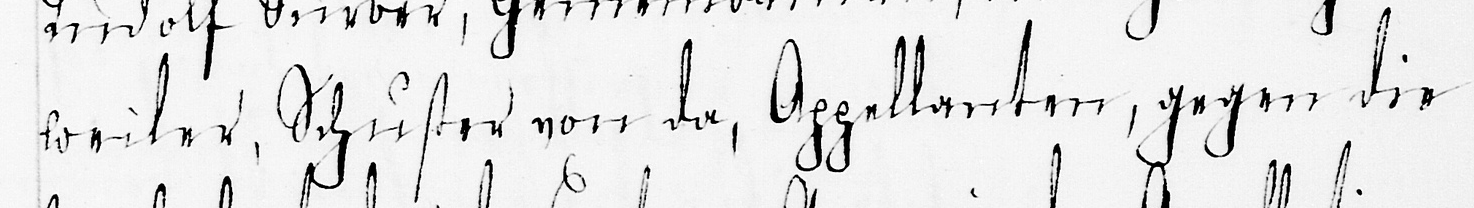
weiler, Schuster von da, Appellanten, gegen die
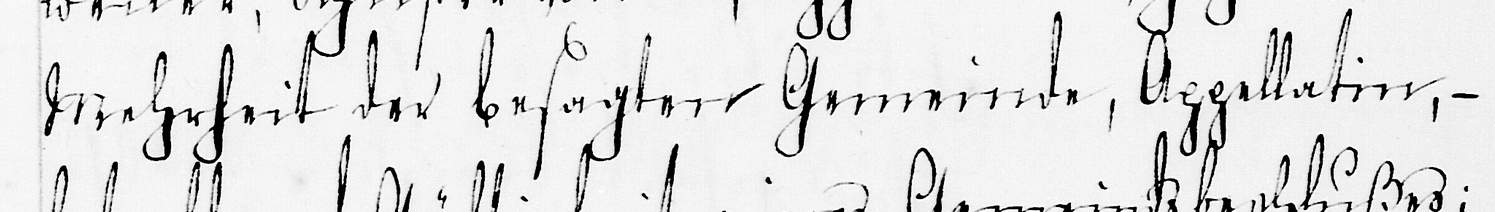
Mehrheit der besagten Gemeinde, Appellatin,
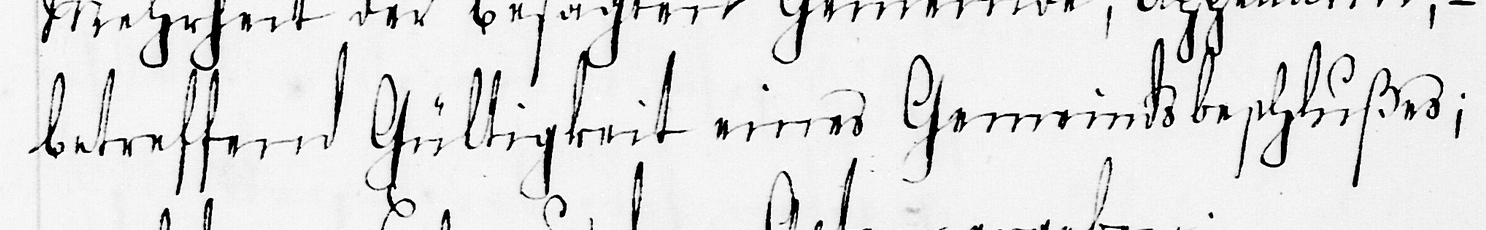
betreffend Gültigkeit eines Gemeindsbeschlußes;
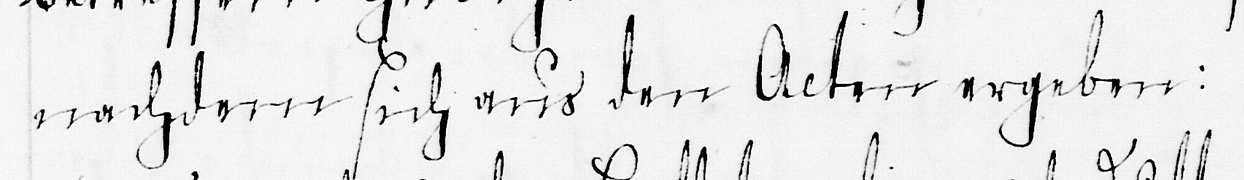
nachdem sich aus den Acten ergeben:
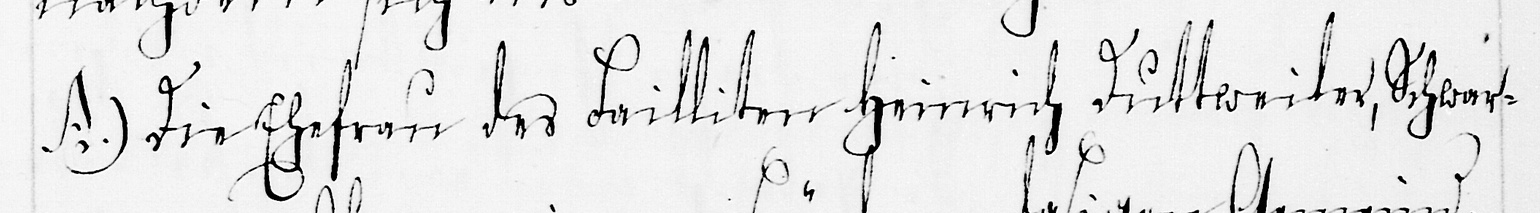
A.) Die Ehefrau des Failliten Heinrich Duttweiler, Schwa¬
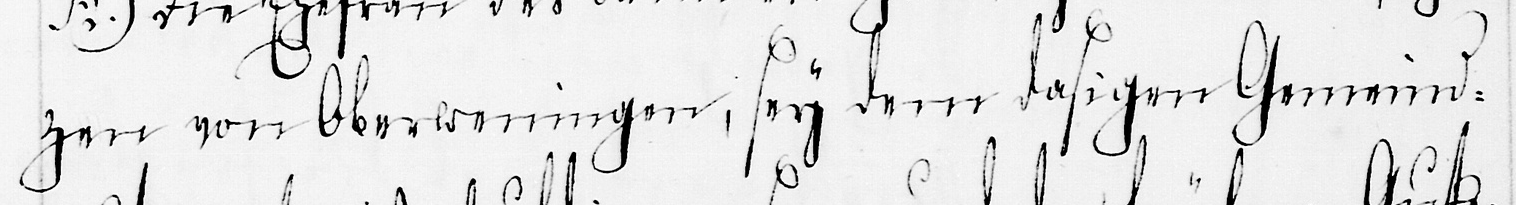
rzen von Oberwenigen, sey dem dasigen Gemeind¬
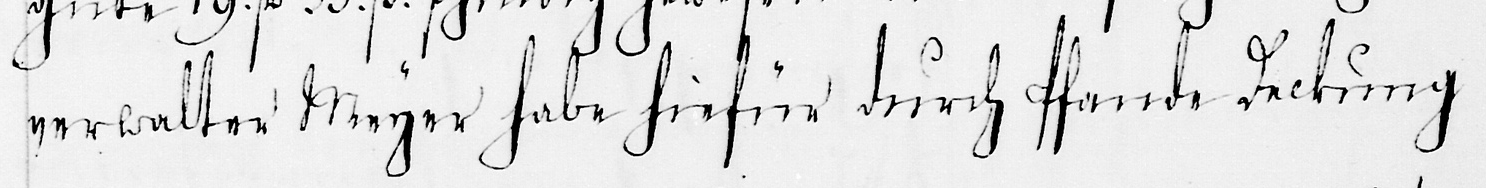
verwalter Meyer habe hiefür durch Pfande Deckung
